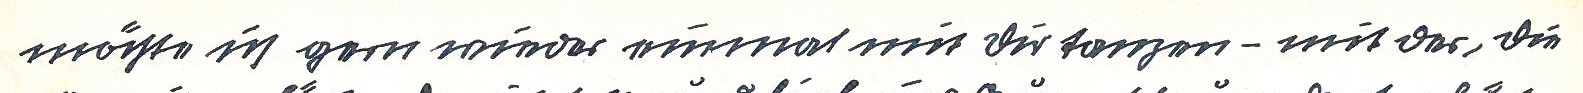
möchte ich gern wieder einmal mit Dir tanzen – mit der, die
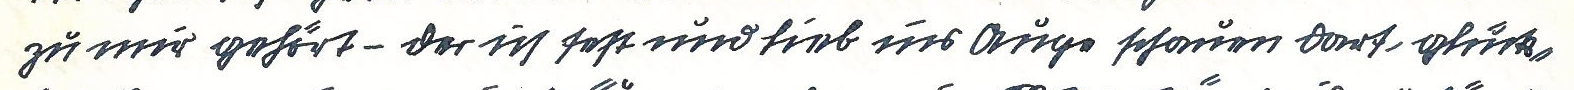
zu mir gehört – der ich fest und lieb ins Auge schauen darf, glück¬
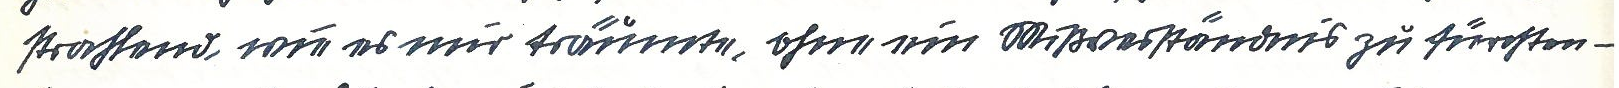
strahlend, wie es mir träumte, ohne ein Mißverständnis zu fürchten –
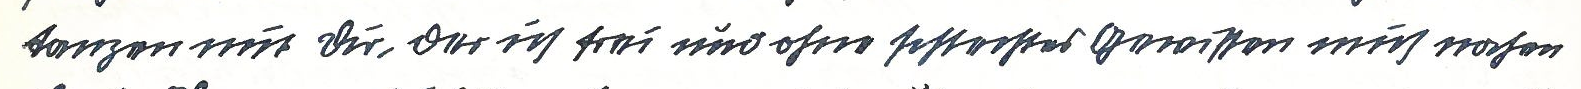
tanzen mit Dir, der ich frei und ohne schlechtes Gewissen mich nahen
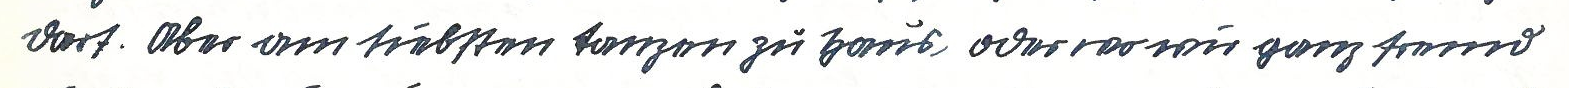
darf. Aber am liebsten tanzen zu Haus, oder wo wir ganz fremd
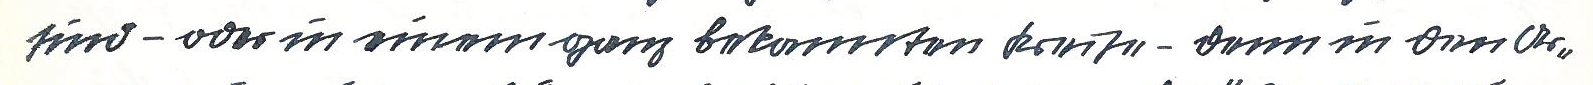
sind – oder in einem ganz bekannten Kreise – denn in den Ar¬
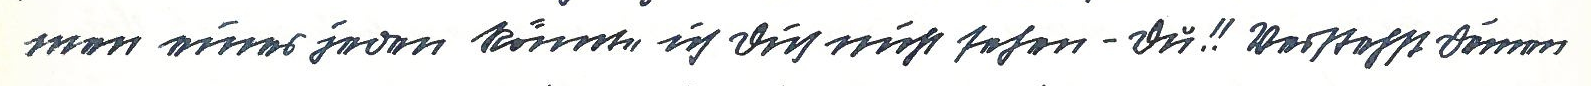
men eines jeden könnte ich Dich nicht sehen – Du!! Verstehst Deinen
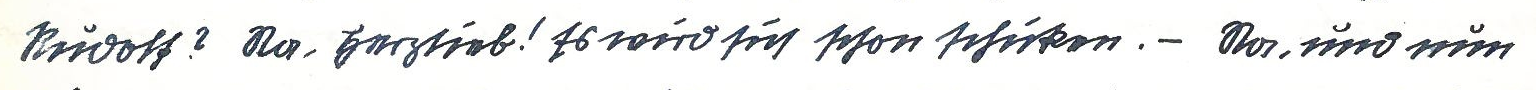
? Na, Herzlieb! Es wird sich schon schicken. – Na, und nun
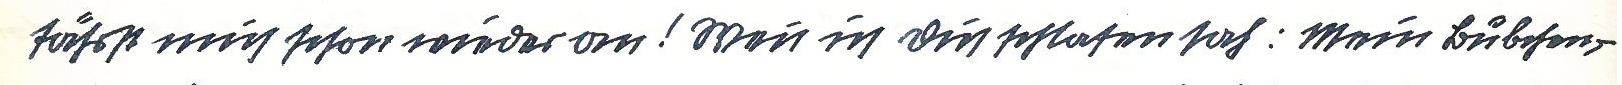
fährst mich schon wieder an! Weil ich Dich schlafen sah: Mein Bübchen, –
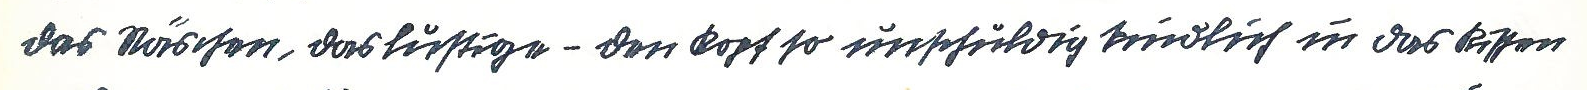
das Näschen, das lustige – den Kopf so unschuldig kindlich in das Kissen
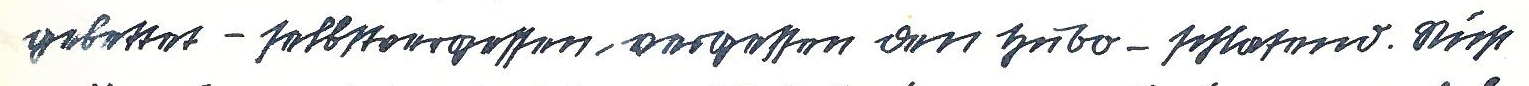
gebettet – selbstvergessen, vergessen den Hubo – schlafend. Nicht
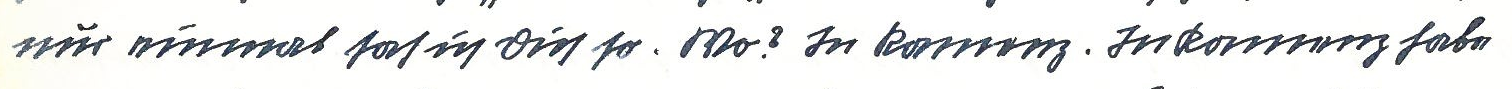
nur einmal sah ich Dich so. Wo? In K. In K. habe
